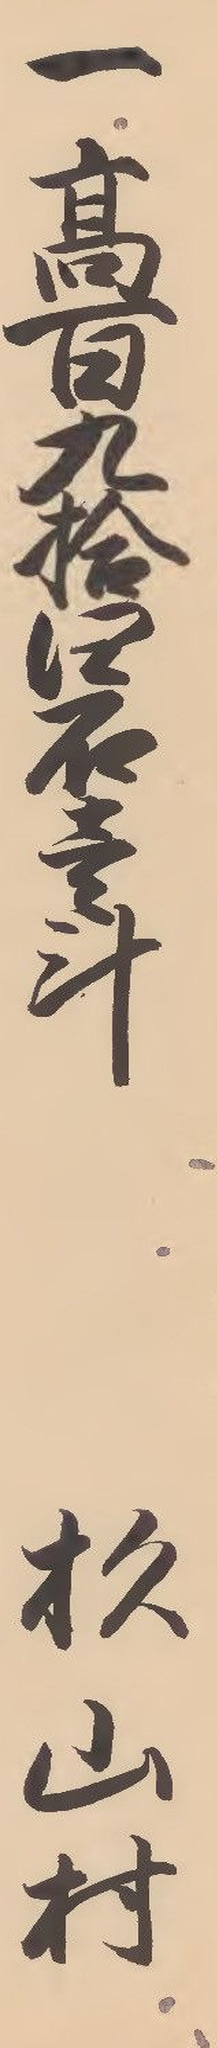一高百九拾四石壱斗杉山村
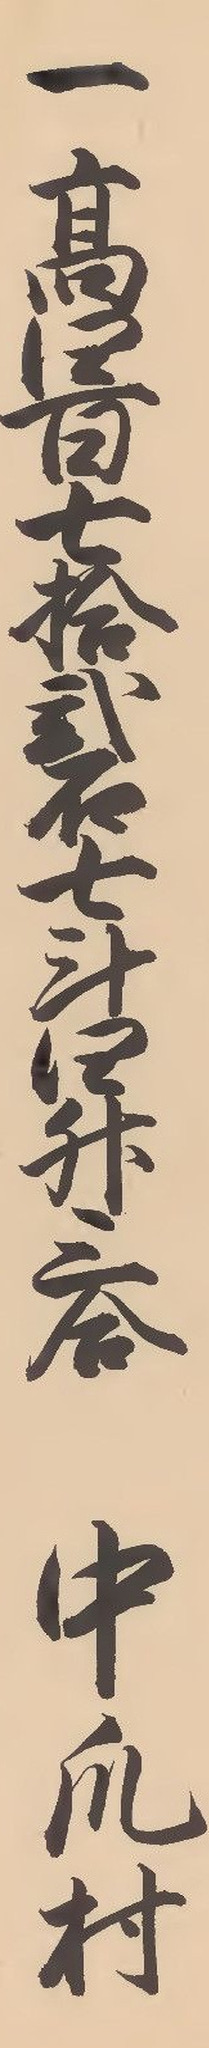一高四百七拾弐石七斗四升三合中爪村
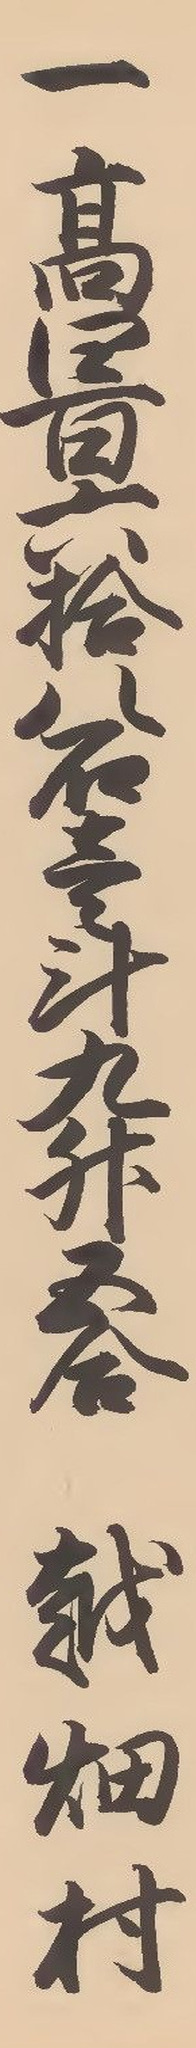一高四百六拾八石壱斗九升五合越畑村
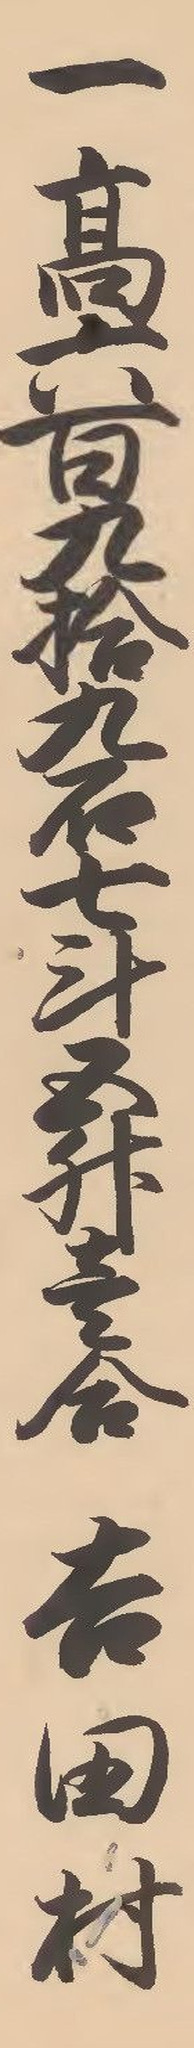一高六百九拾九石七斗五升壱合吉田村
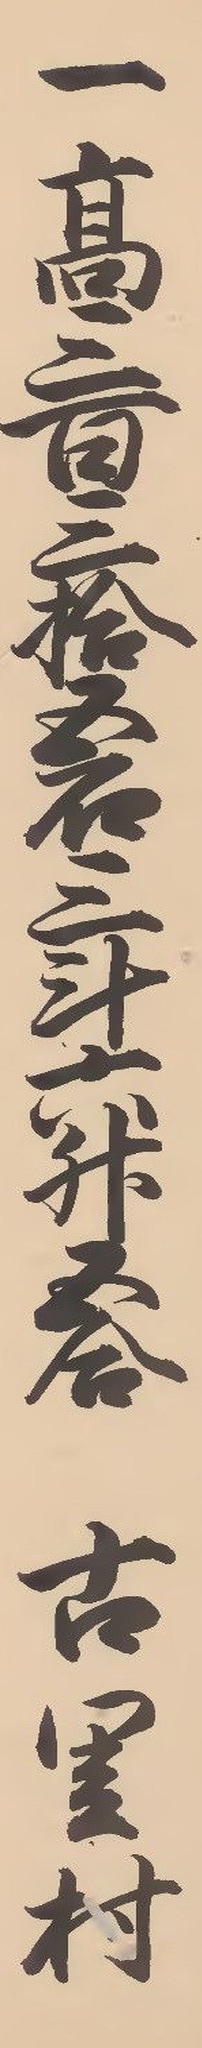一高三百三拾五石三斗六升五合古里村
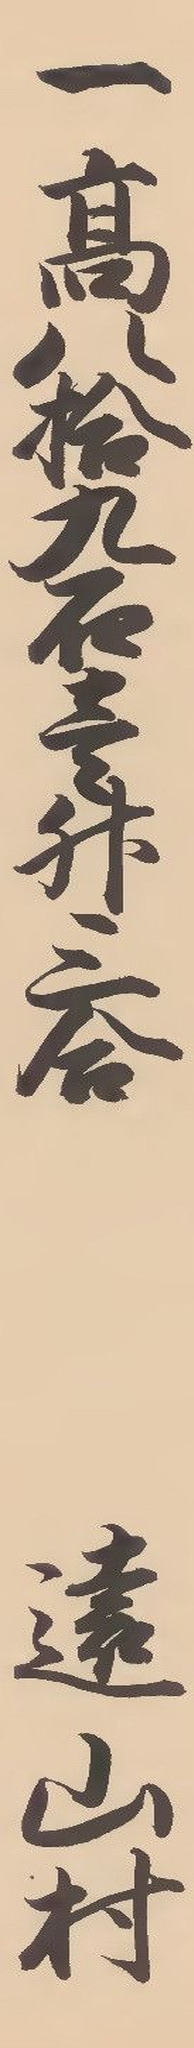一高八拾九石壱升三合遠山村
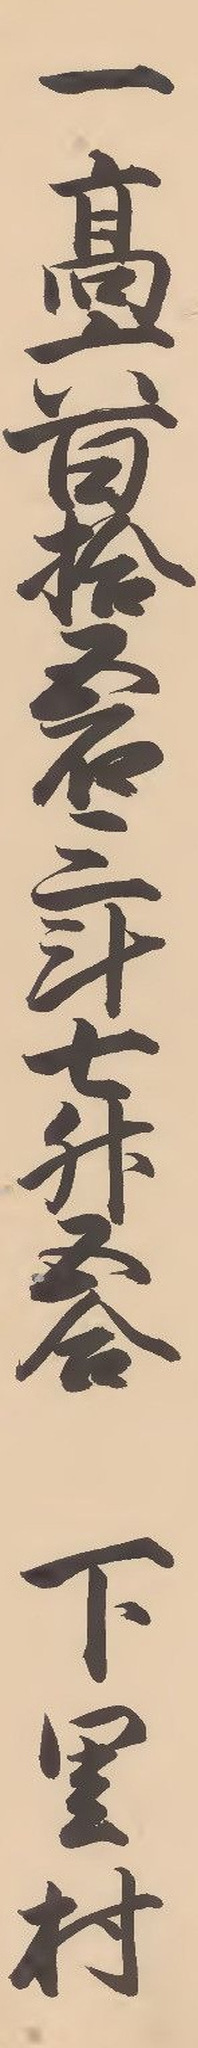一高六百拾五石三斗七升五合下里村

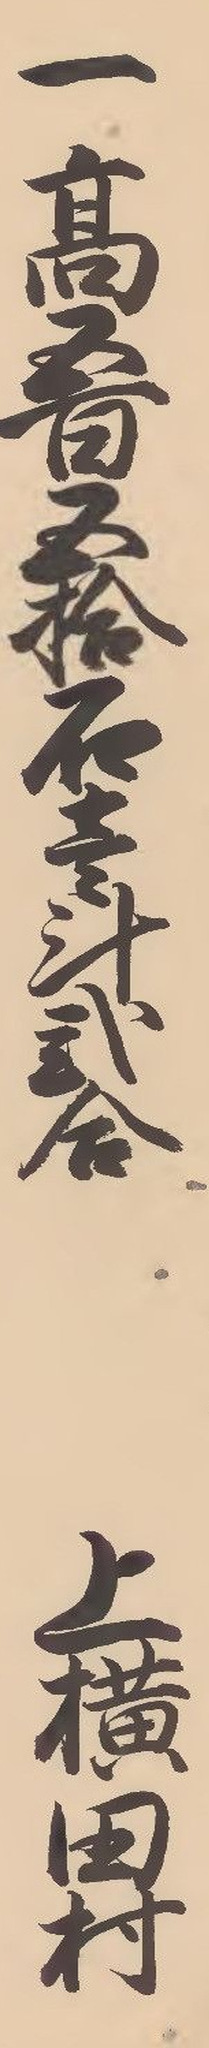一高五百五拾石壱斗弐合上横田村
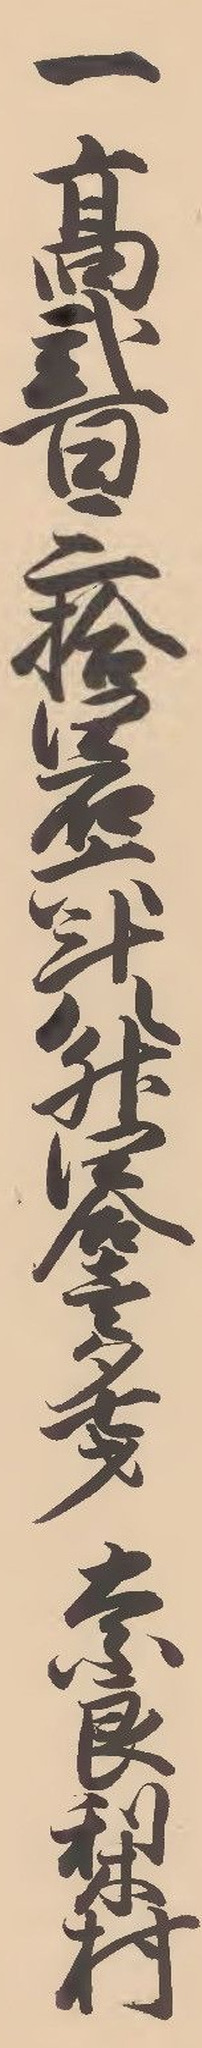一高弐百三拾四石六斗八升四合壱勺七才奈良梨村
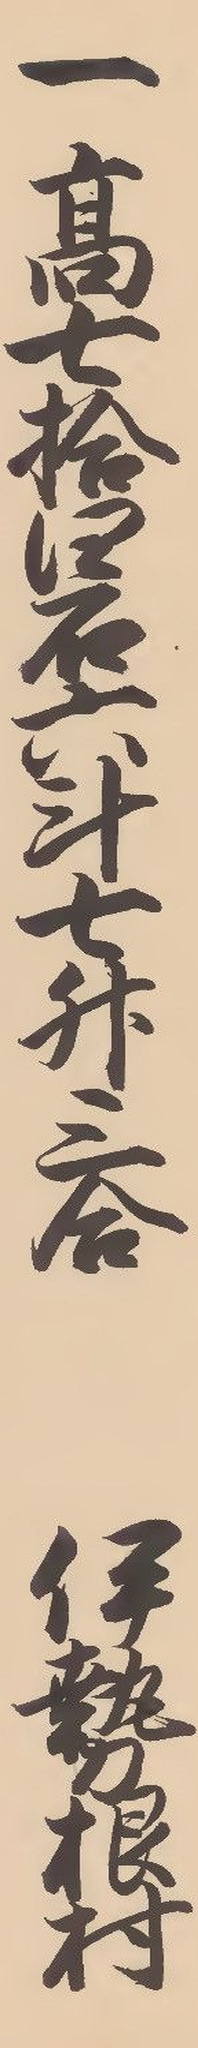一高七拾四石六斗七升三合伊勢根村
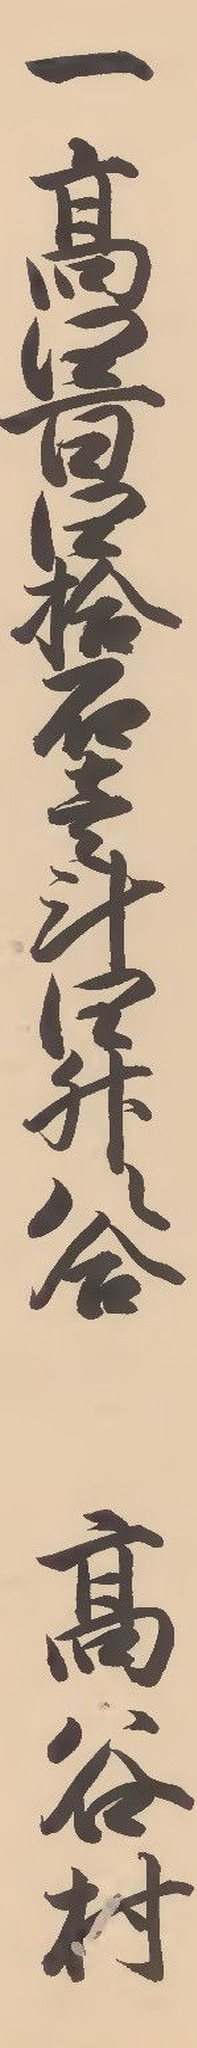一高四百四拾石壱斗四升八合高谷村
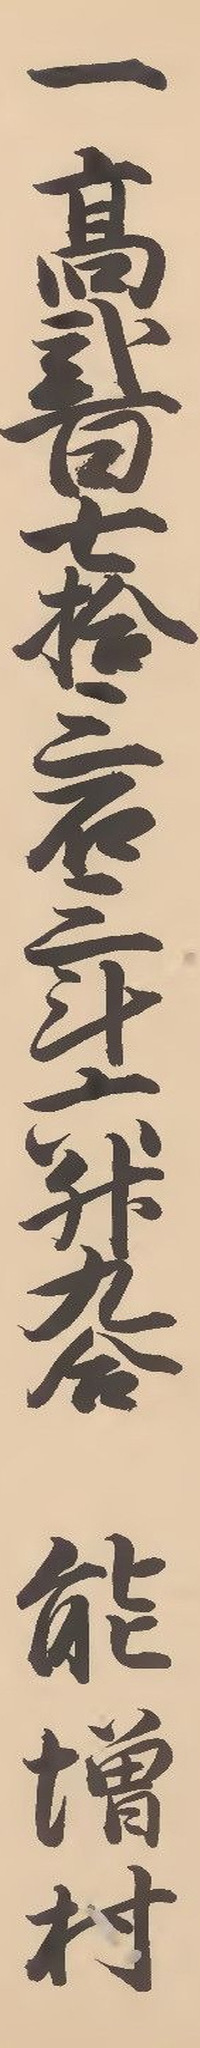一高弐百七拾三石三斗六升九合能増村
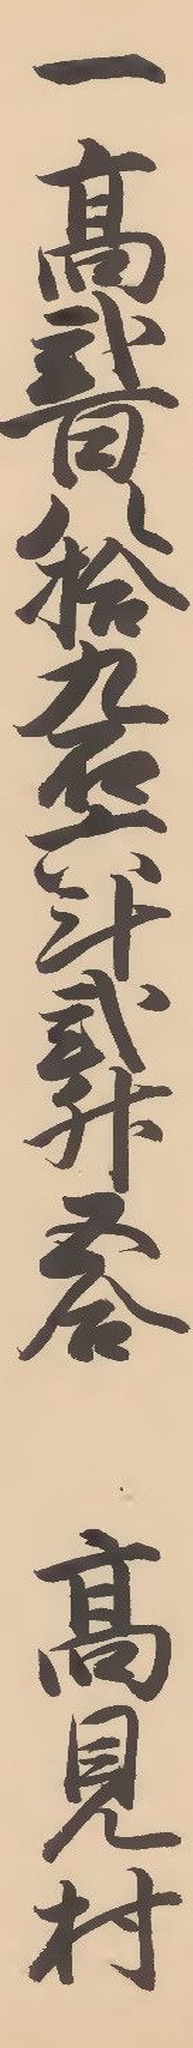一高弐百八拾九石六斗弐升五合高見村
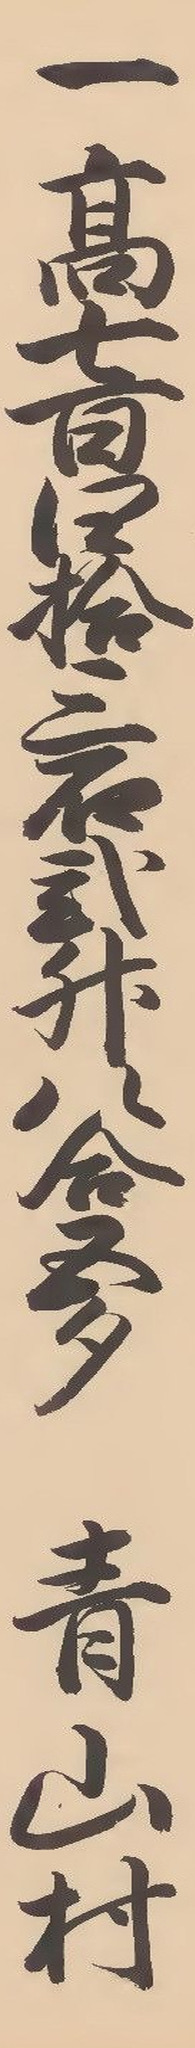一高七百四拾三石弐升八合五勺青山村
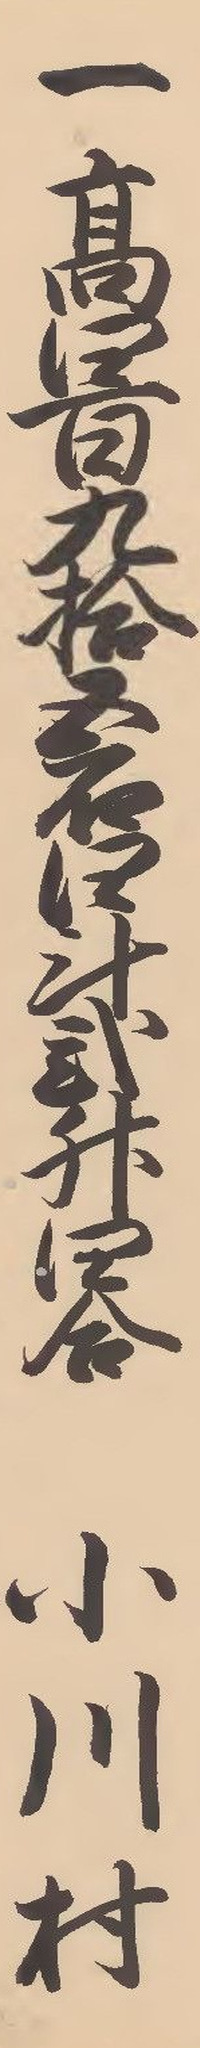一高四百九拾五石四斗弐升四合小川村

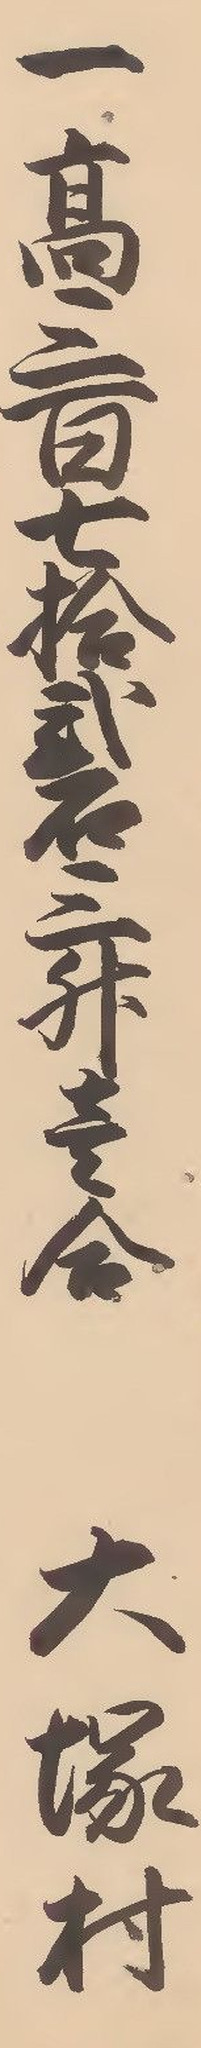一高三百七拾弐石三升壱合大塚村
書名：武蔵国郷帳　下
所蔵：国立公文書館 National Archives of Japan
